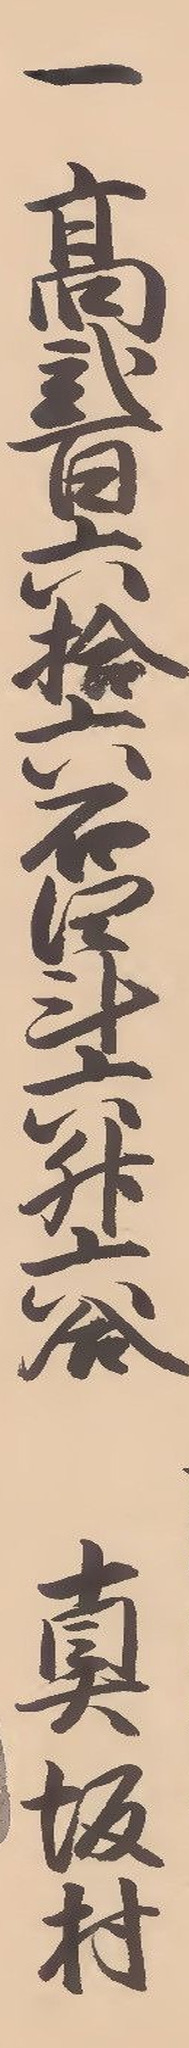一高弐百六拾六石四斗六升六合真坂村
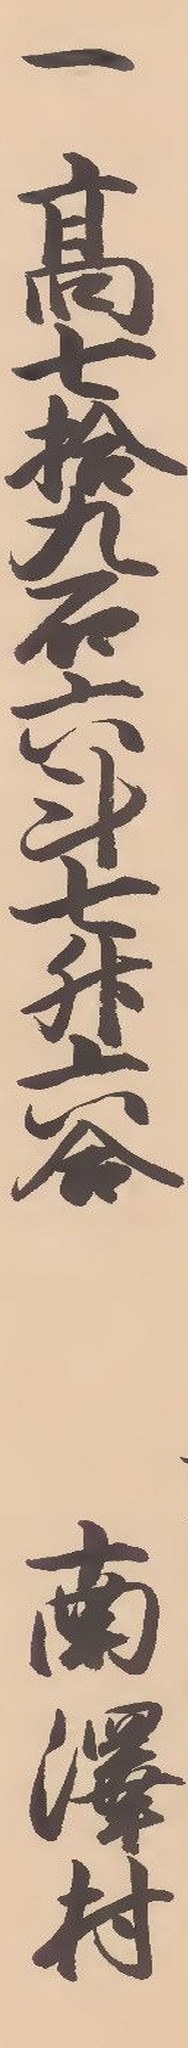一高七拾九石六斗七升六合南沢村
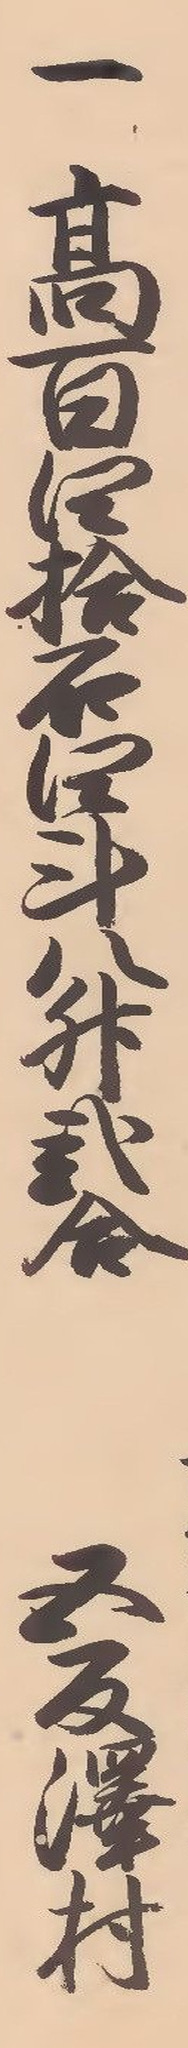一高百四拾石四斗八升弐合五反沢村
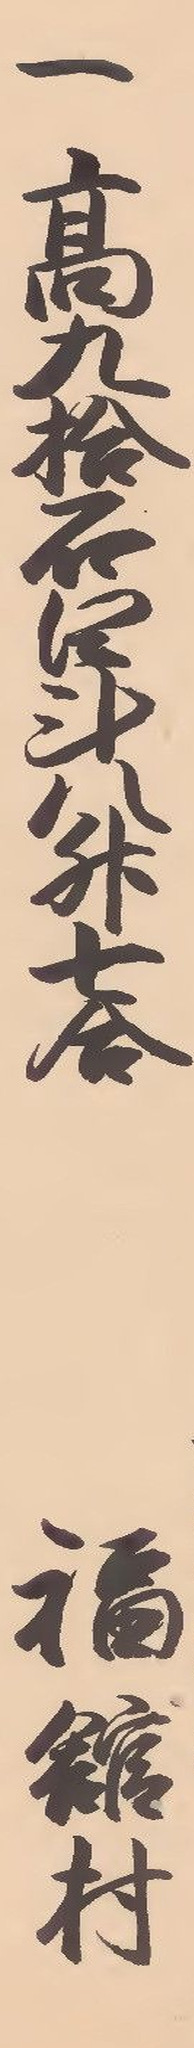一高九拾石四斗八升七合福館村
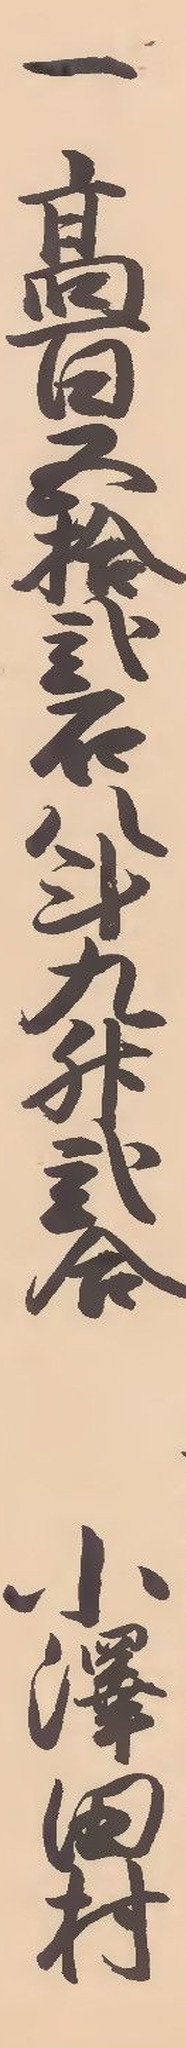一高百五拾弐石八斗九升弐合小沢田村
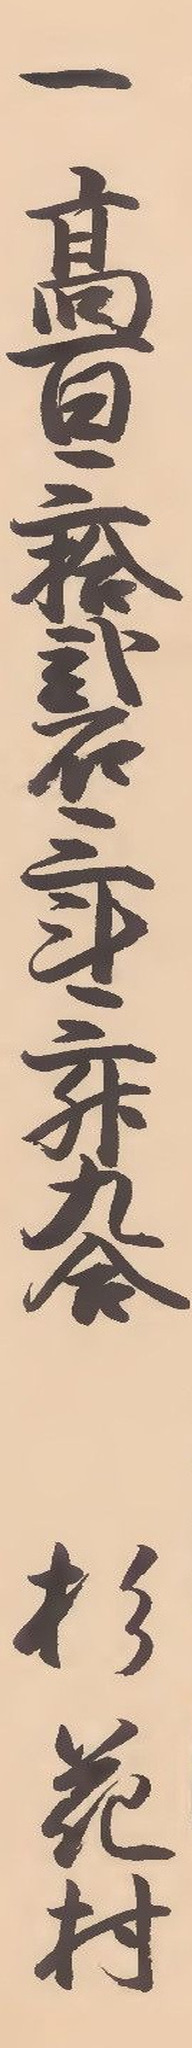一高百三拾弐石三斗三升九合杉花村
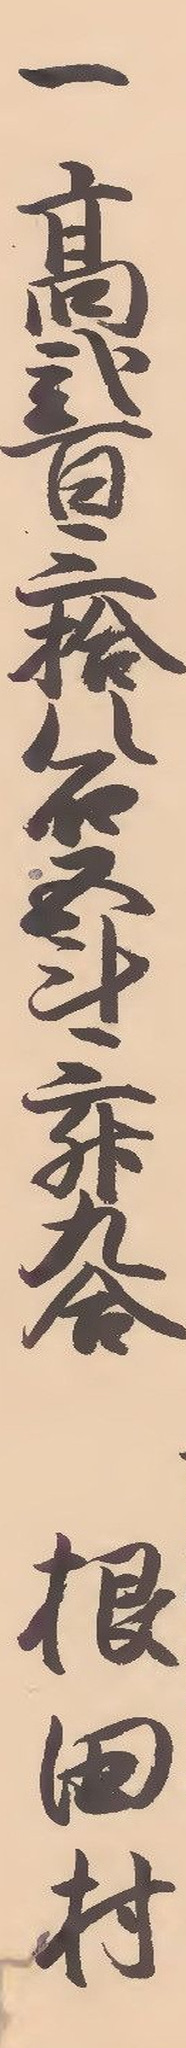一高弐百三拾八石五斗三升九合根田村

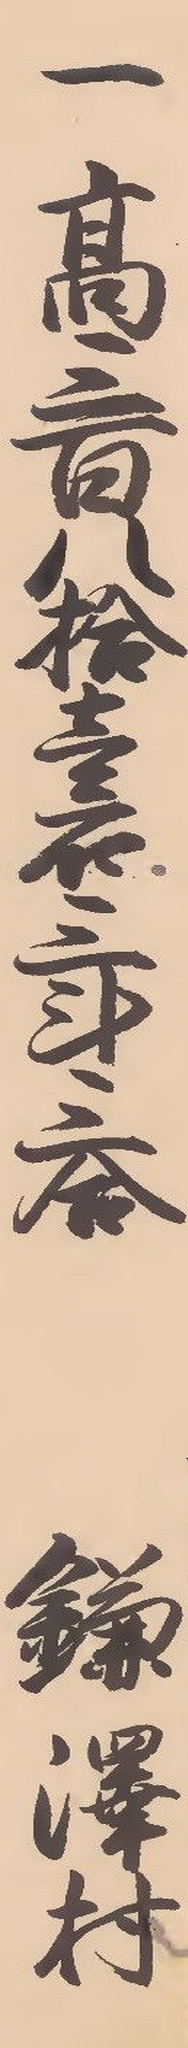一高三百八拾壱石三斗三合鎌沢村
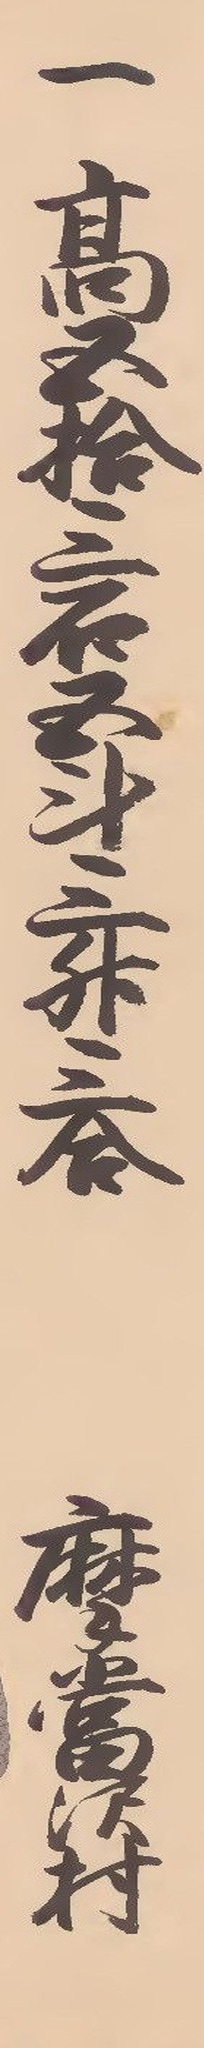一高五拾三石五斗三升三合摩当沢村
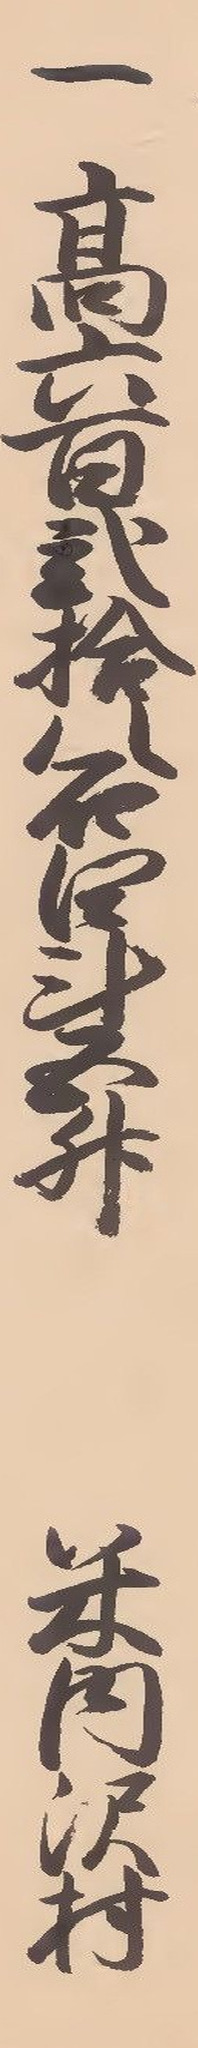一高六百弐拾八石四五升米内沢村
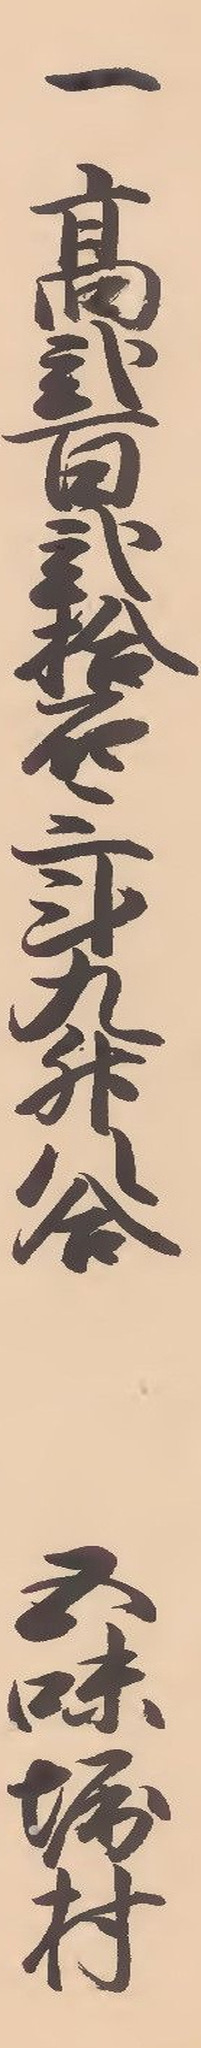一高弐百弐拾石三斗九升八合五味堀村
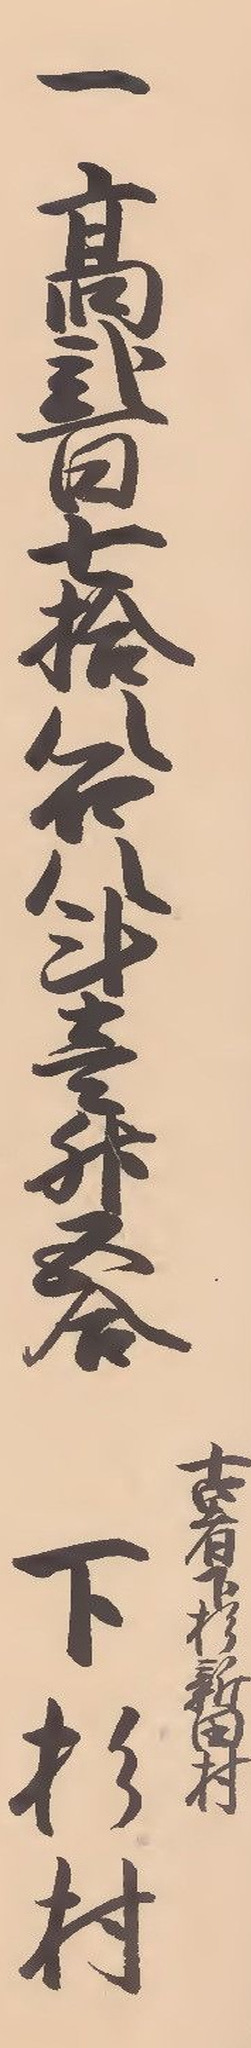一高弐百七拾八石八斗壱升五合下杉村
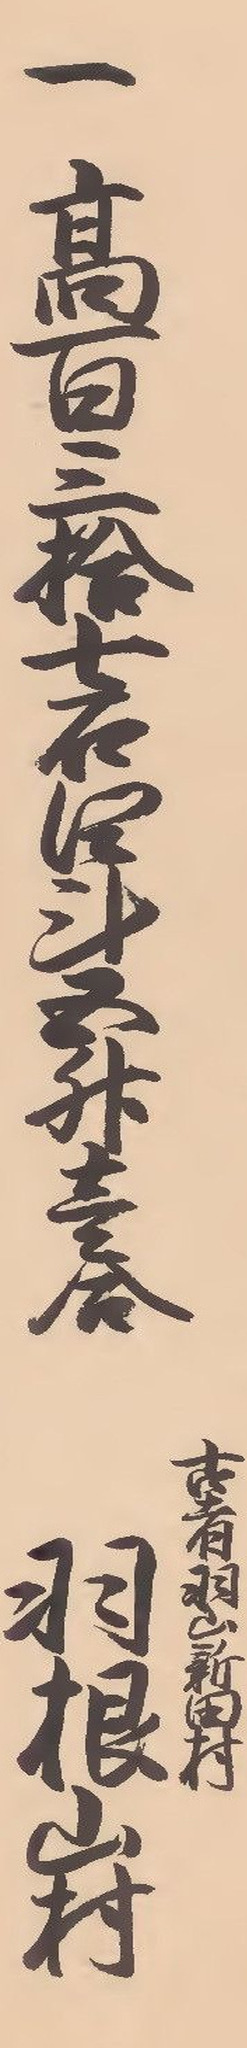一高百三拾七石四斗五升壱合羽根山村
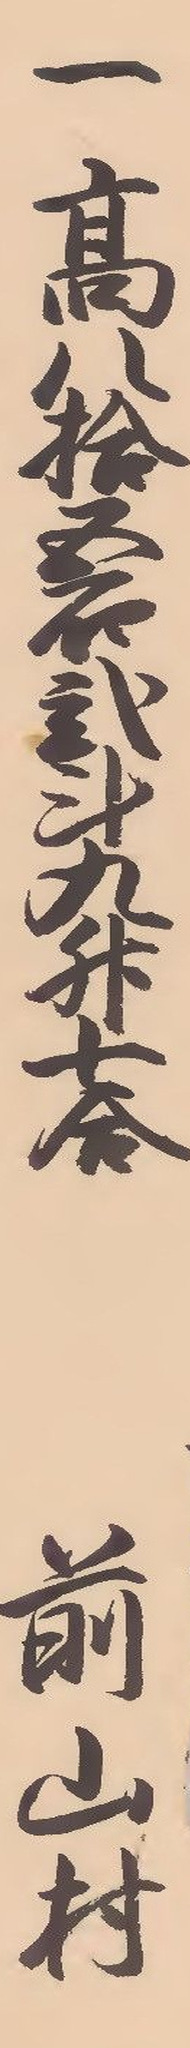一高八拾五石弐斗九升七合前山村
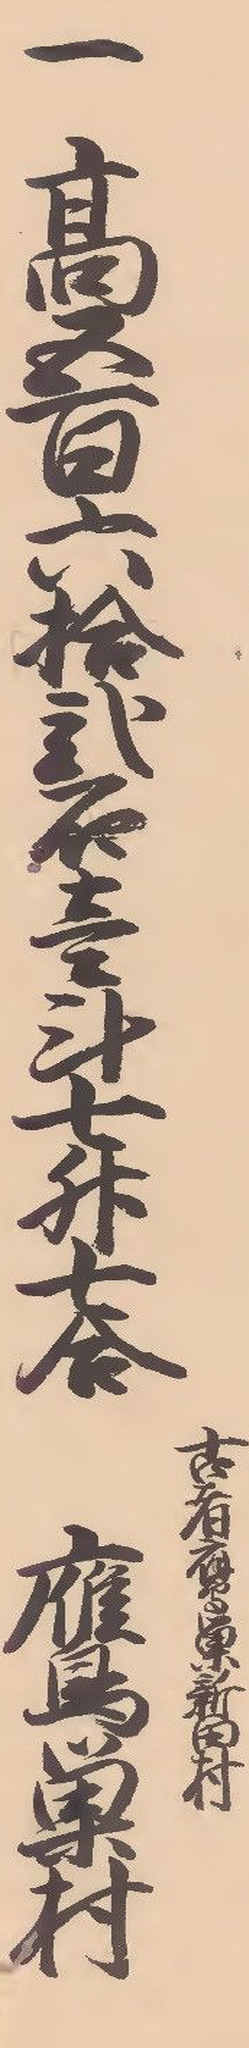一高五百六拾弐石壱斗七升七合鷹巣村

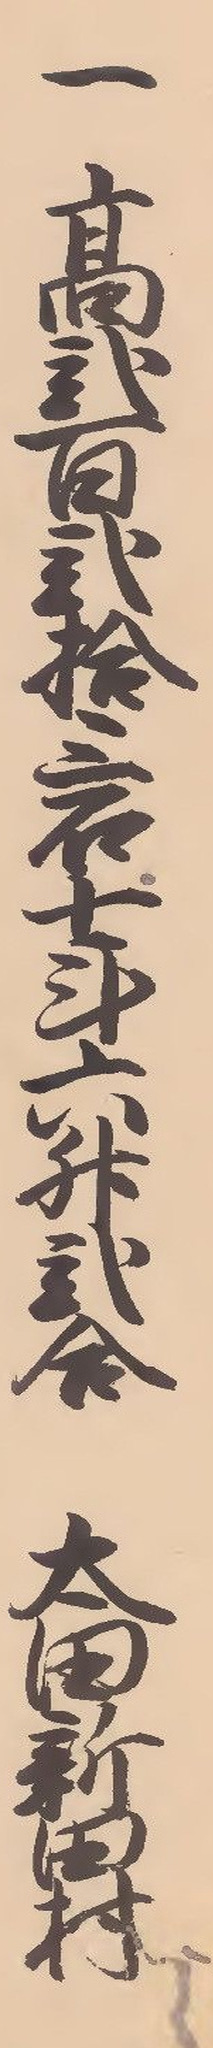一高弐百弐拾三石七斗六升弐合太田新田村
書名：出羽国郷帳　５
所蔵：国立公文書館 National Archives of Japan
